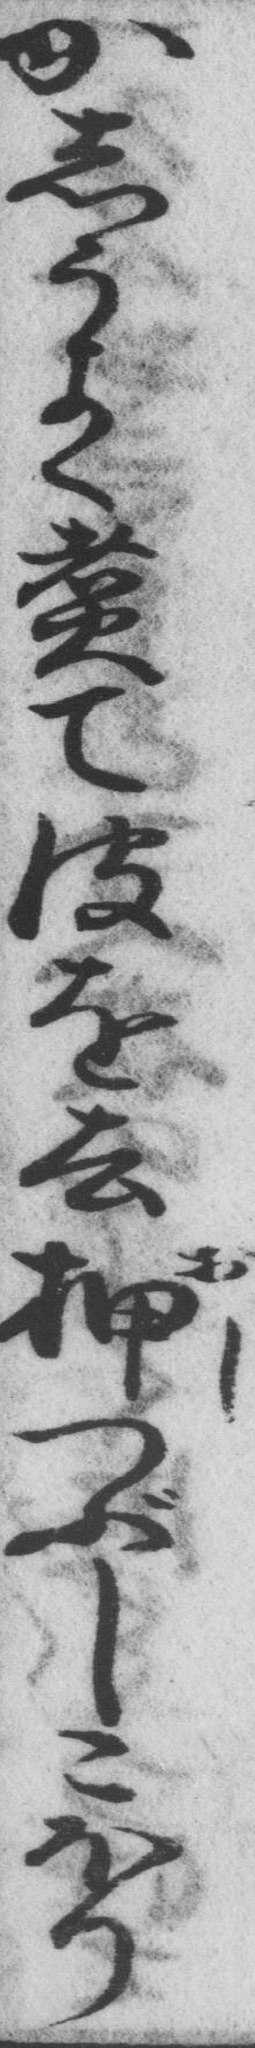かしうよく煮て皮を去押つぶしこほり
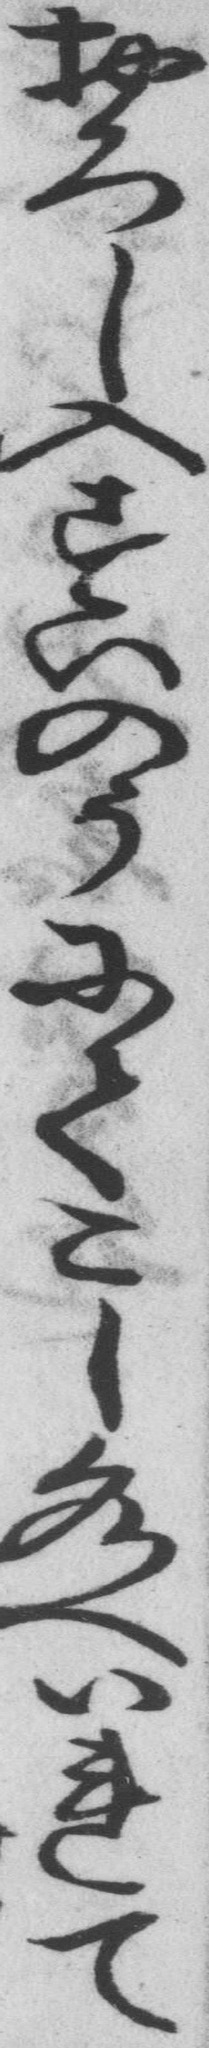おろし入すいのうにてこし水へいれて
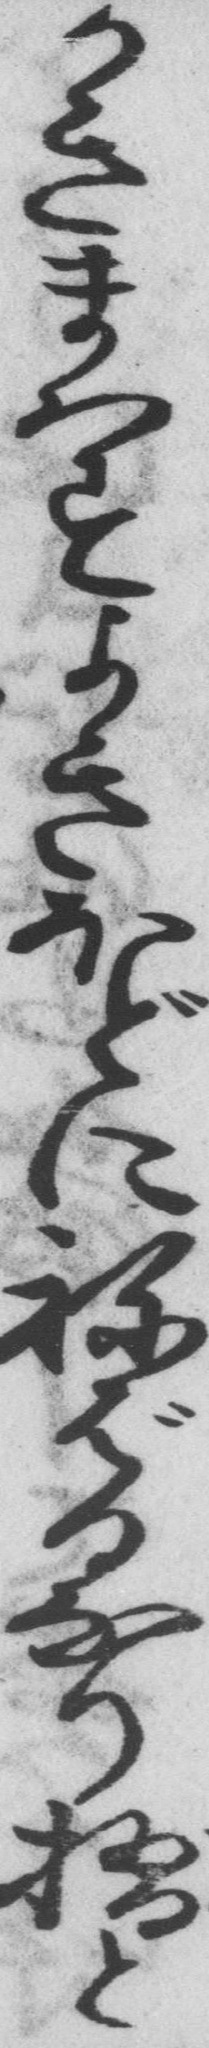かきまはすよきほどにねばるなり摺と
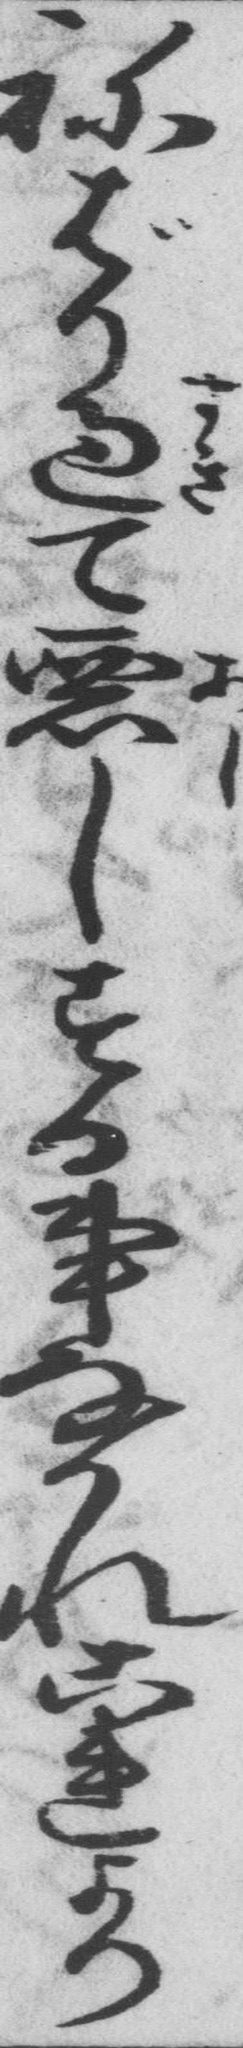ねばり過て悪しする事なかれこれより
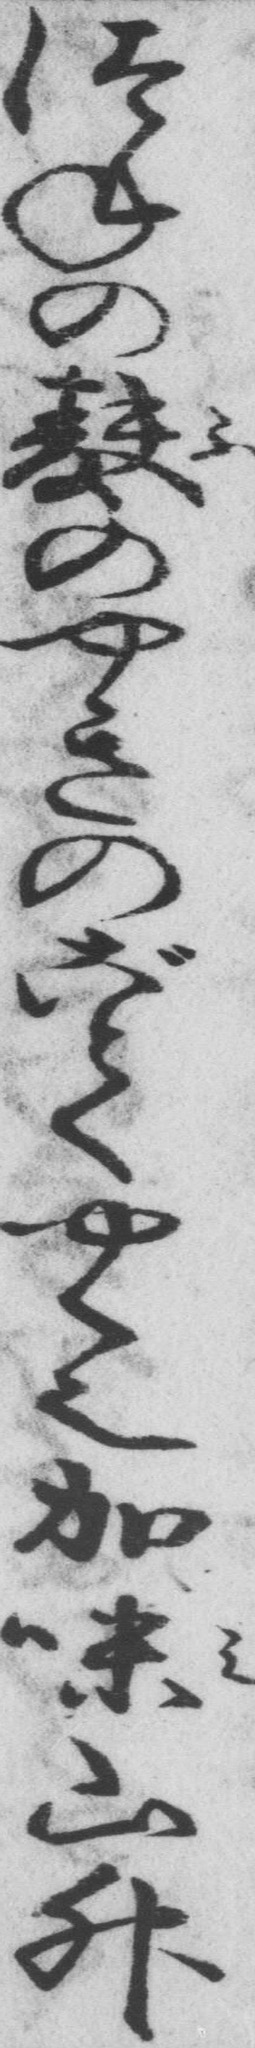つねの麩のやきのごとくやく也加味山升
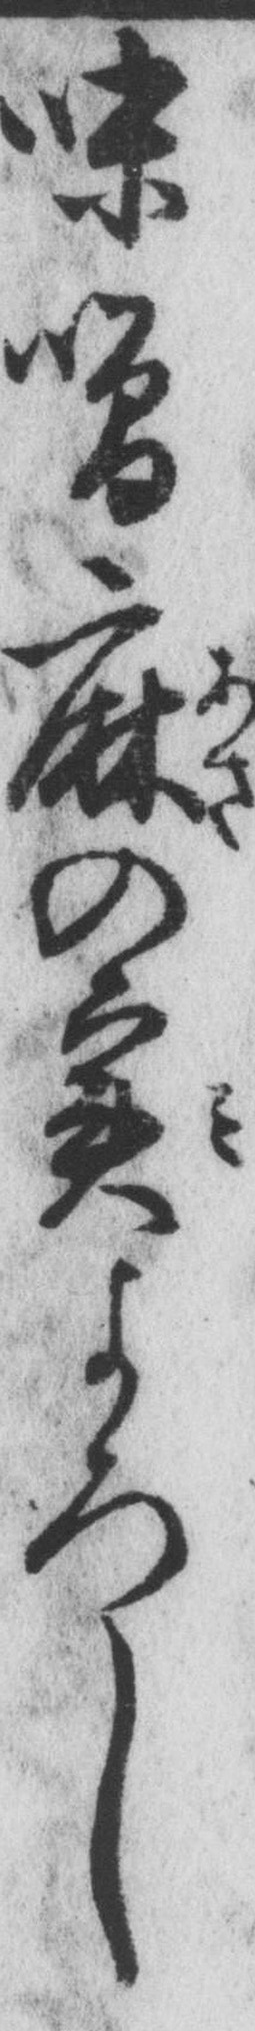味噌麻の実よろし
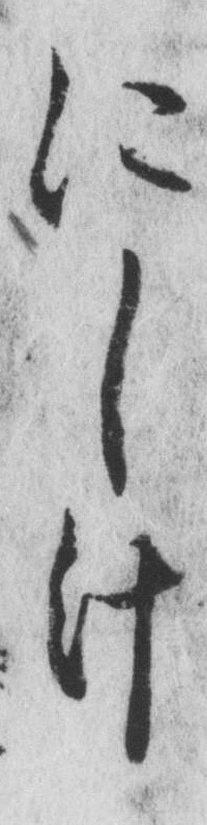にし汁
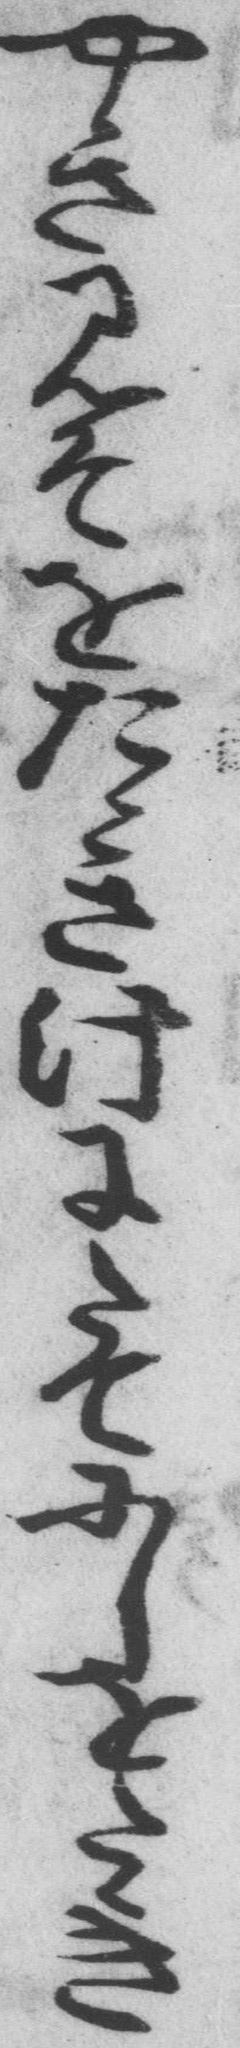やきみそをたゝき汁にたてにしをたゝき
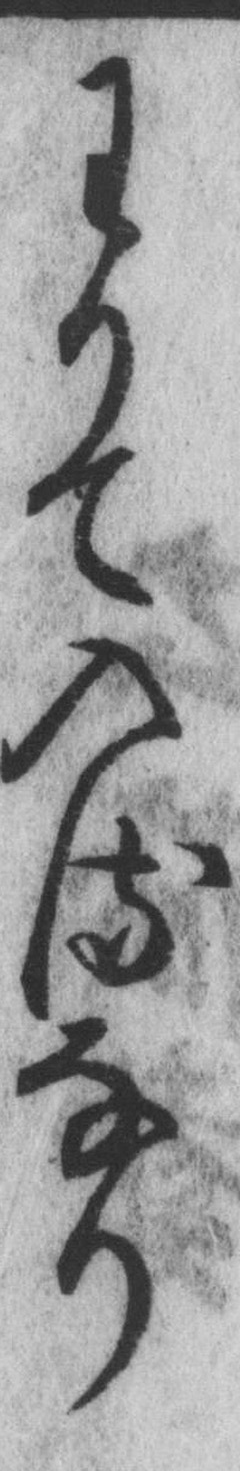わりて入るなり

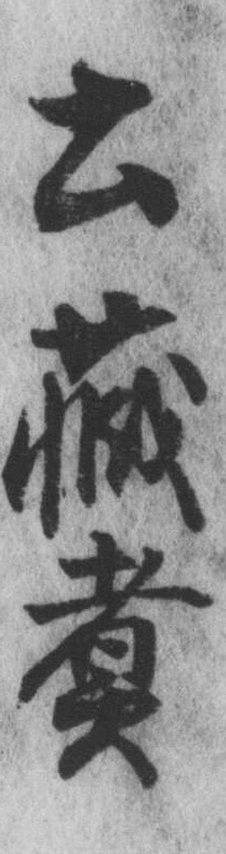土蔵煮
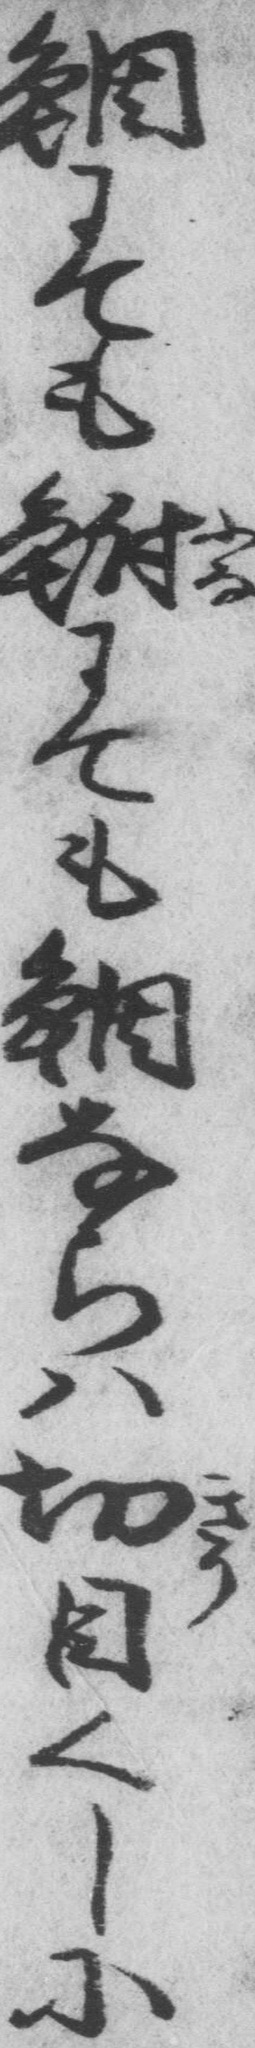鯛にても鮒にても鯛ならは切目くしに
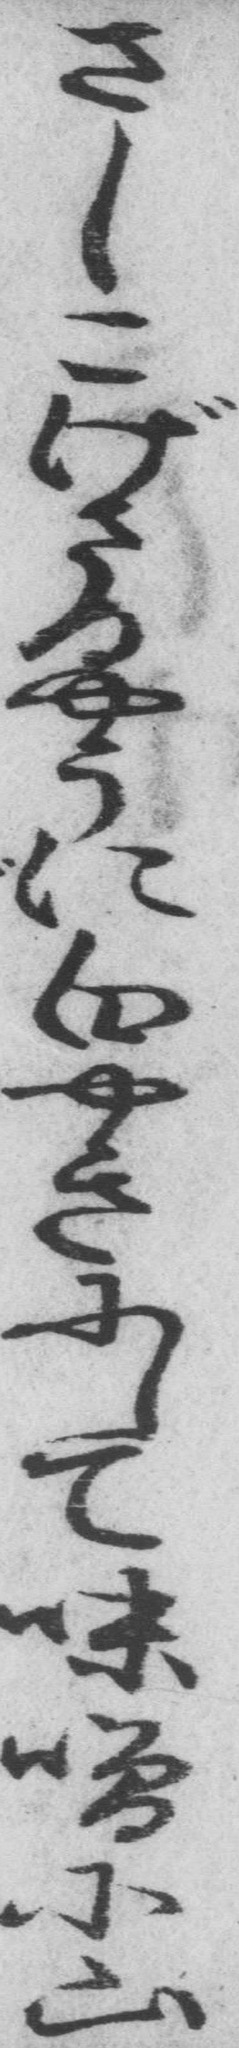さしこげさるやうに白やきにして味噌に山
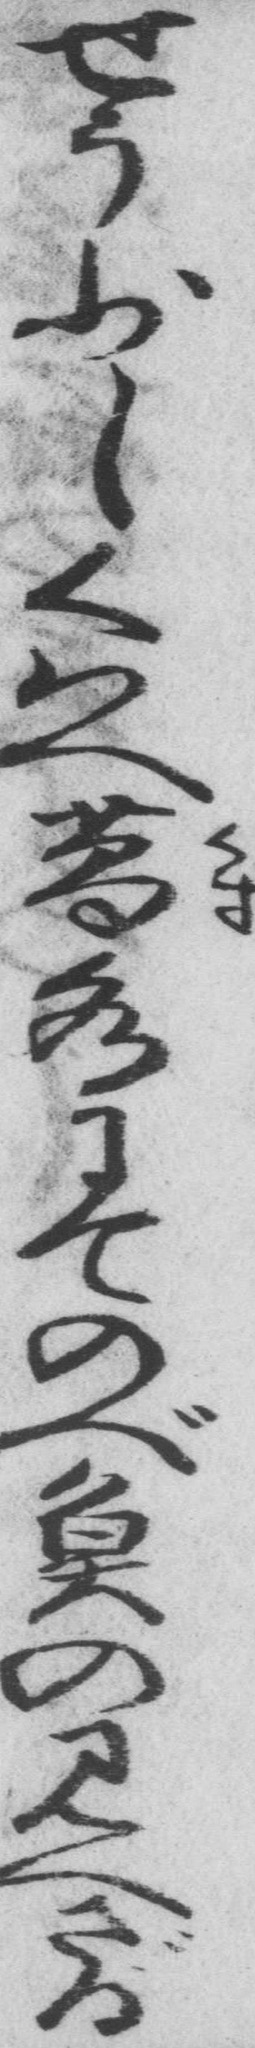せう少しくはへ葛水にてのべ魚の見へざる
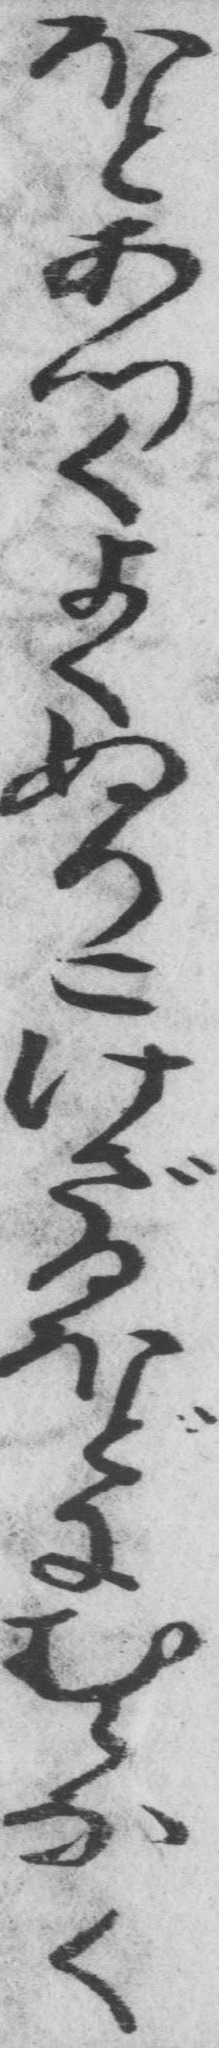ほとあつくよくぬりこけざるほどにむらなく
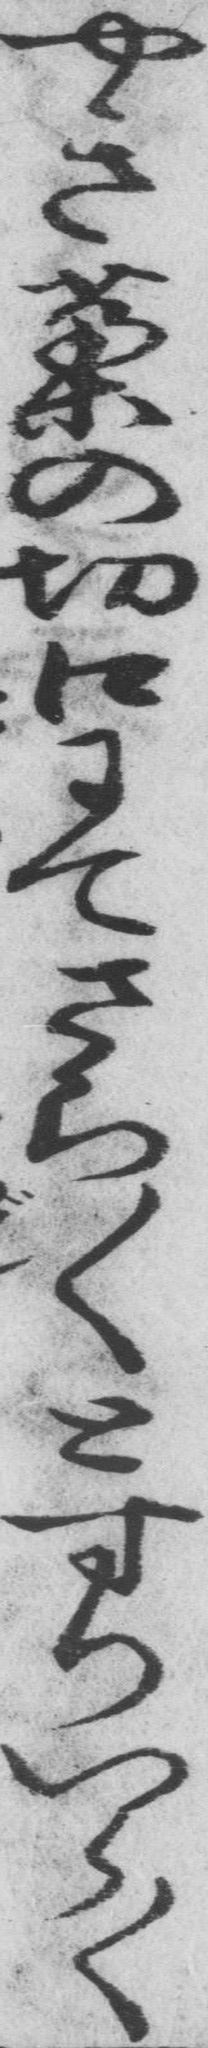やき藁の切口にてさら〳〵とすりいら〳〵
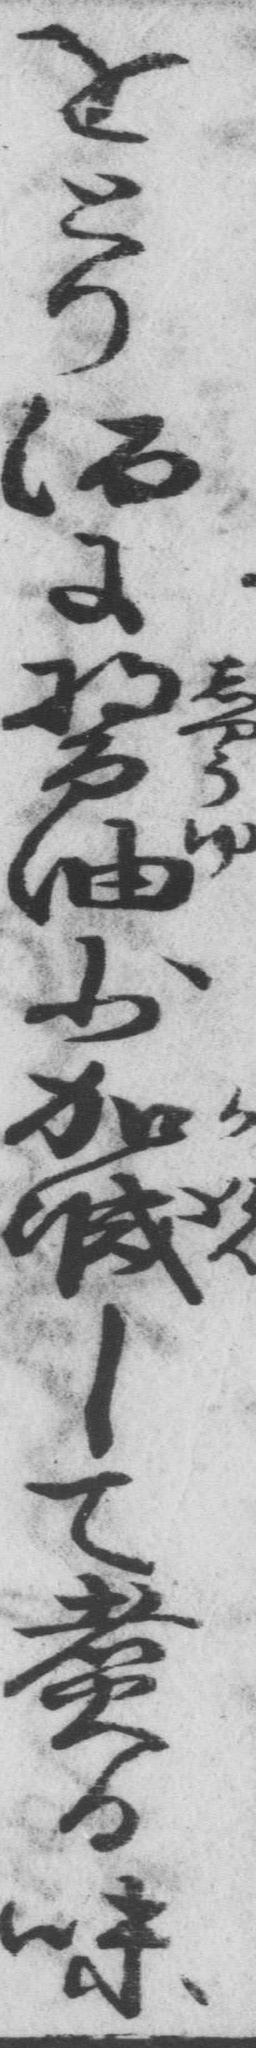をとり酒に醤油少加減して煮る味
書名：料理山海郷
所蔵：大阪府立大学学術情報センター 国文学研究資料館
